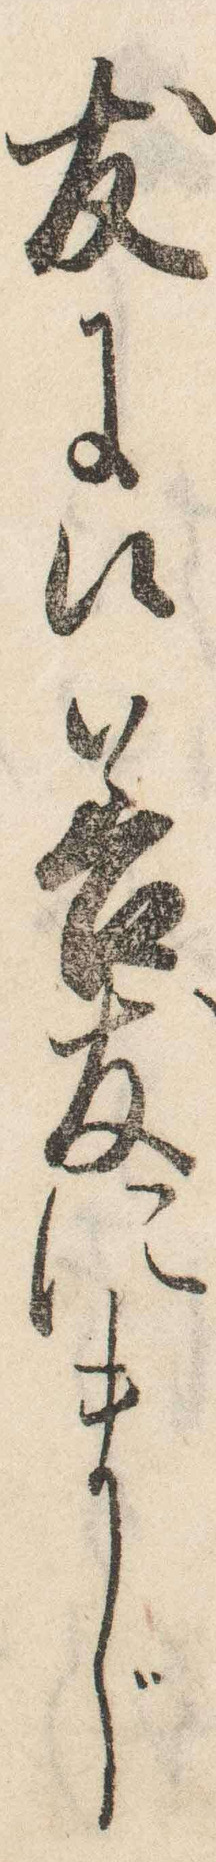友に候善友にまじ
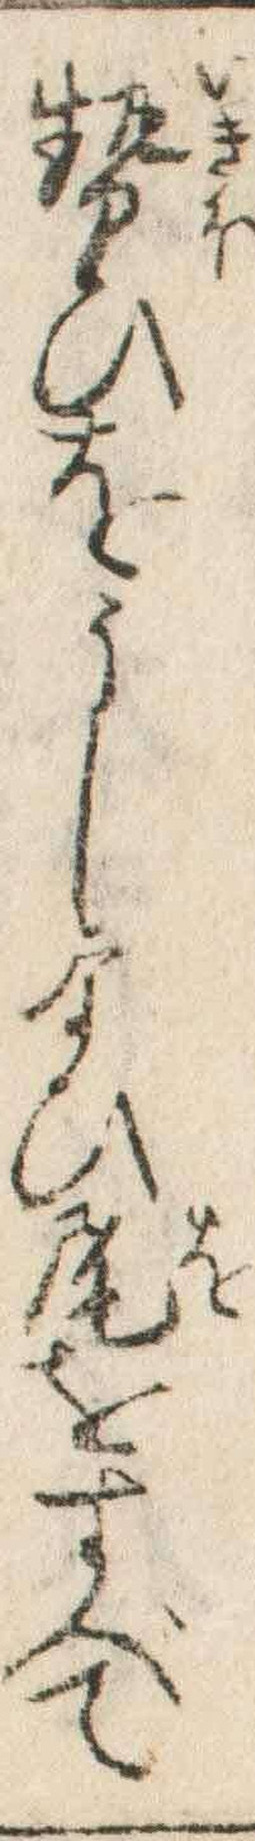勢ひをうしなひ尾をすへて
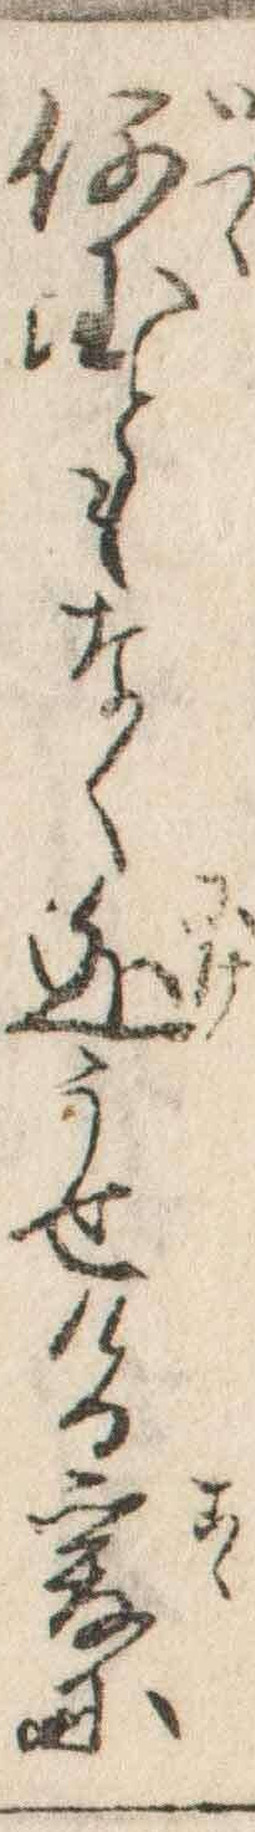何国ともなく逃うせける爰に
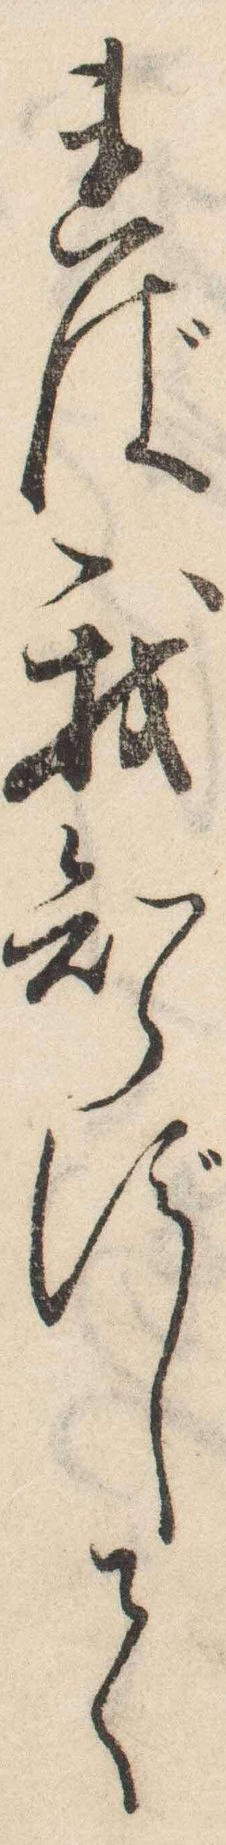れば我知らずして
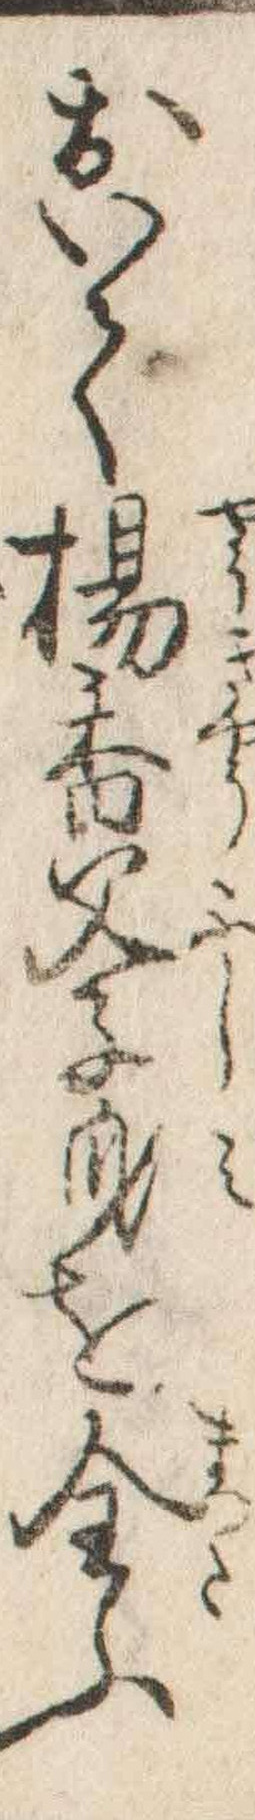おいて楊香父子身を全ふ
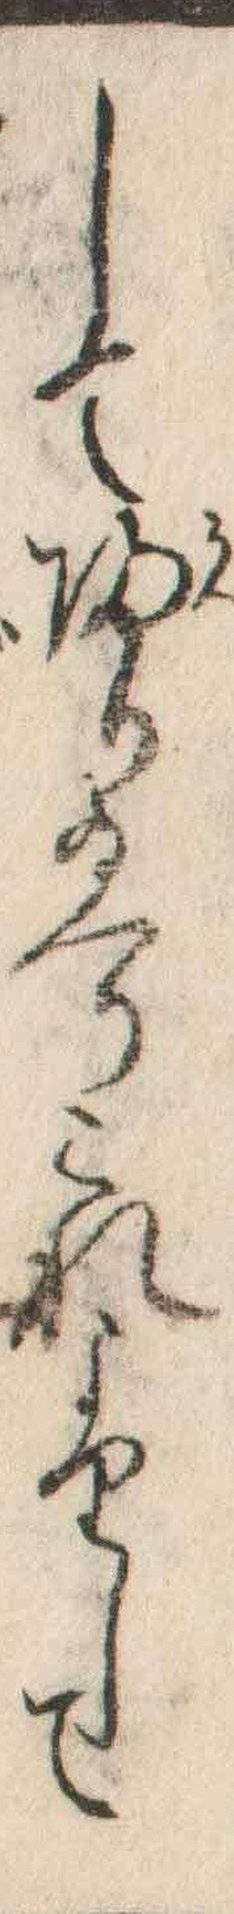して帰り給へりこれよりして
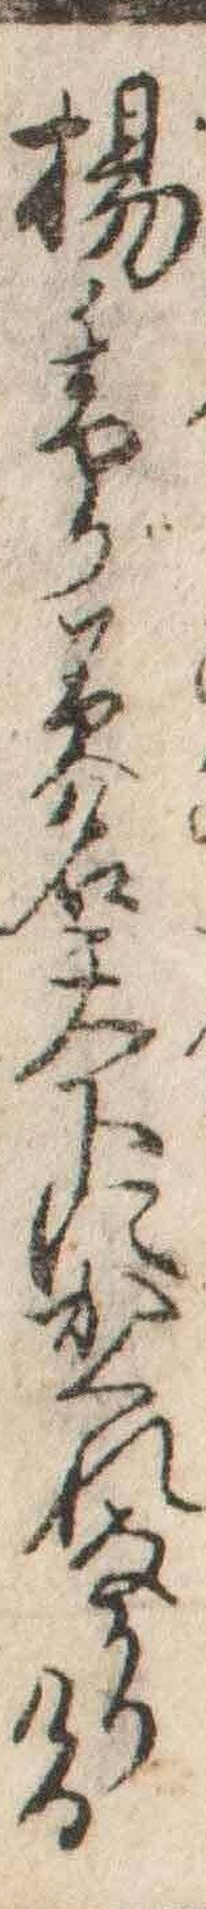楊香が美名天下にかくれなかりける
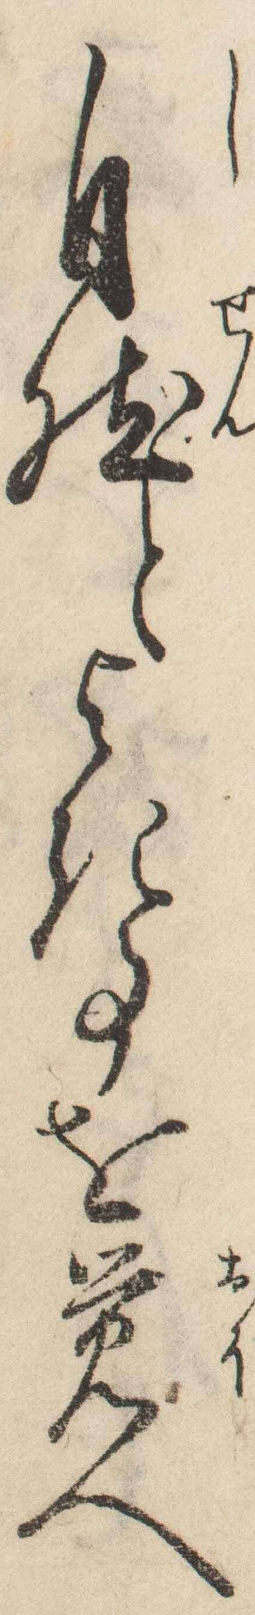自然とよき事を覚へ

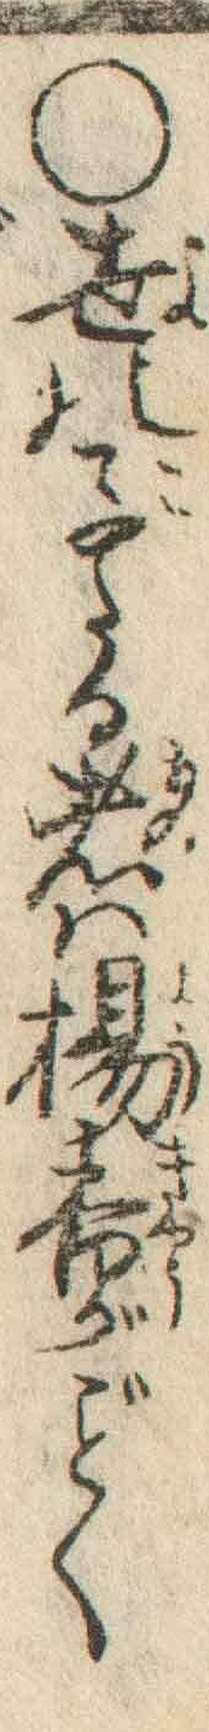〇世の子たる者は楊香がごとく
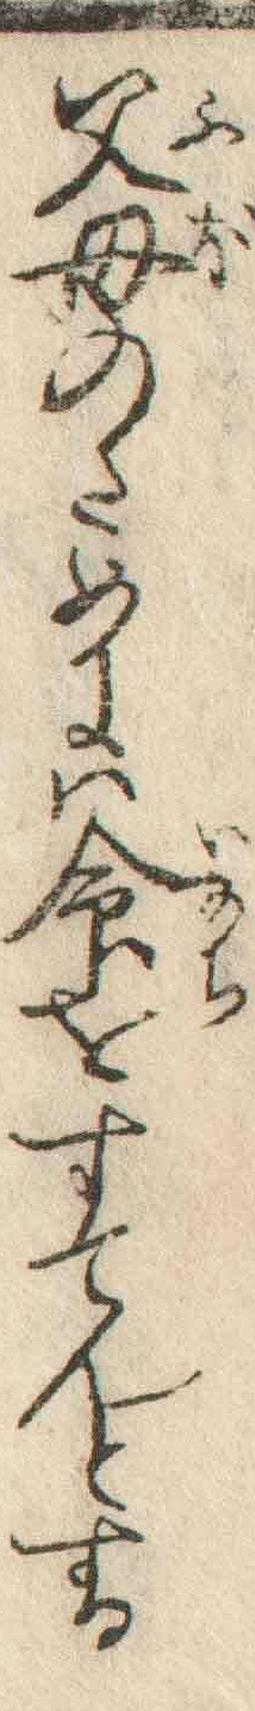父母のためには命をすてんとする
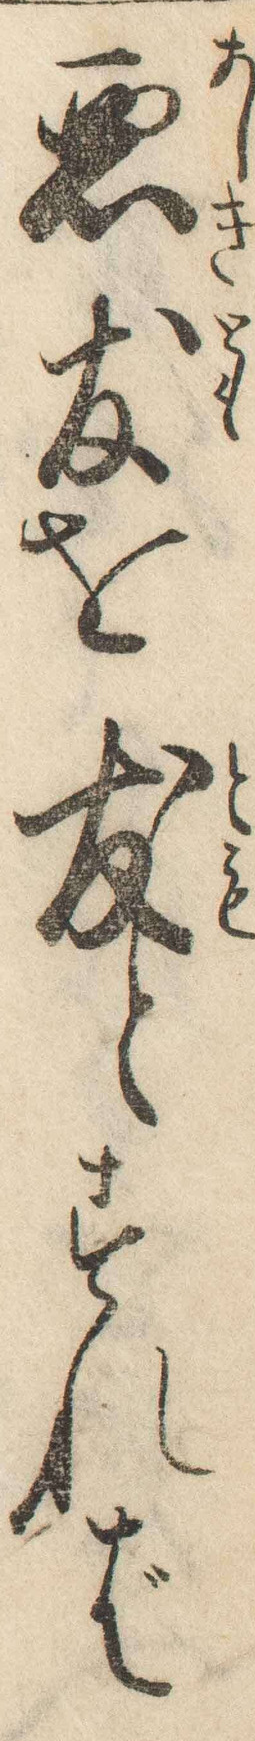悪友を友とすれば
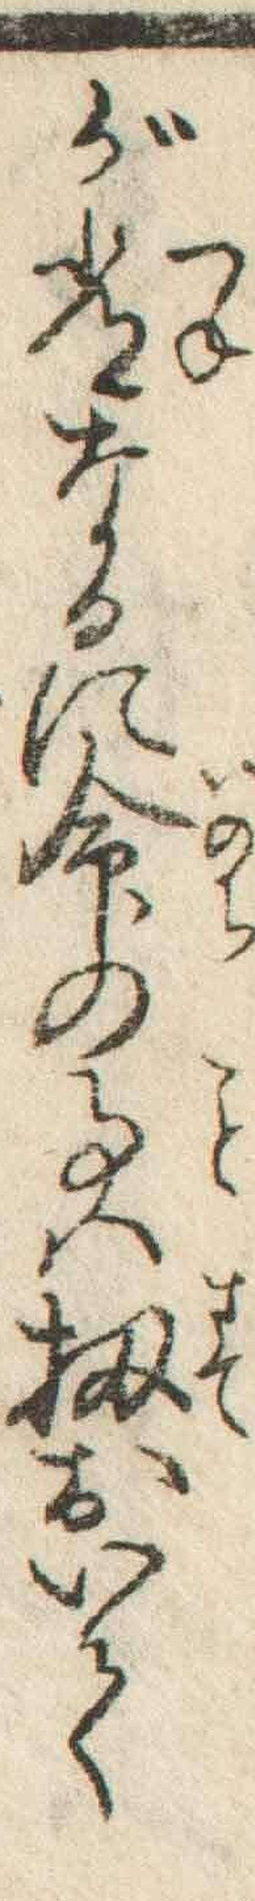が常なるに命の事は扨おいて
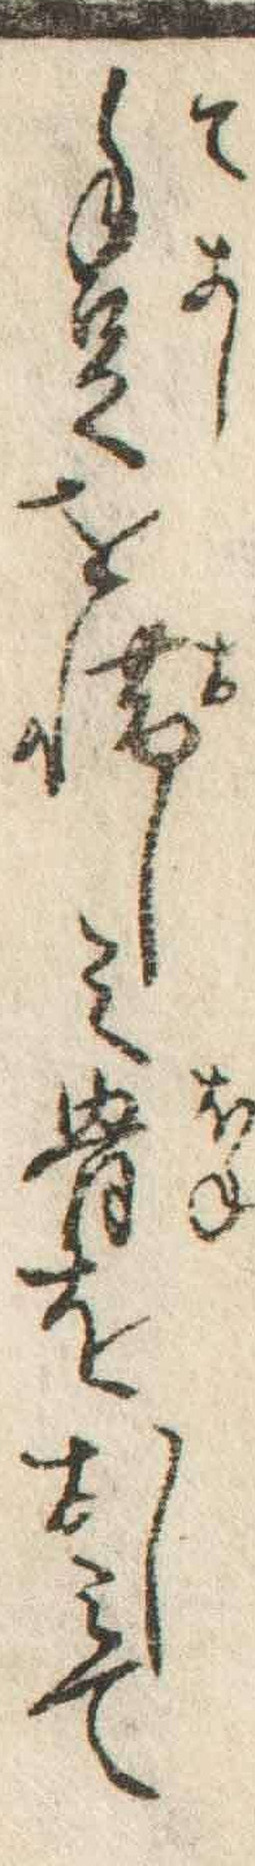手足を惜しみ骨をおしみて
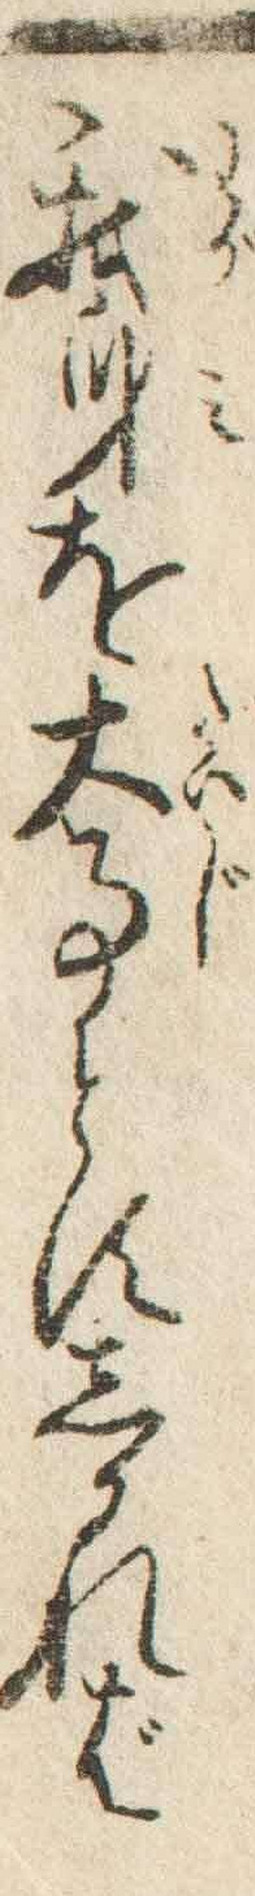我身を大事とすしかれば
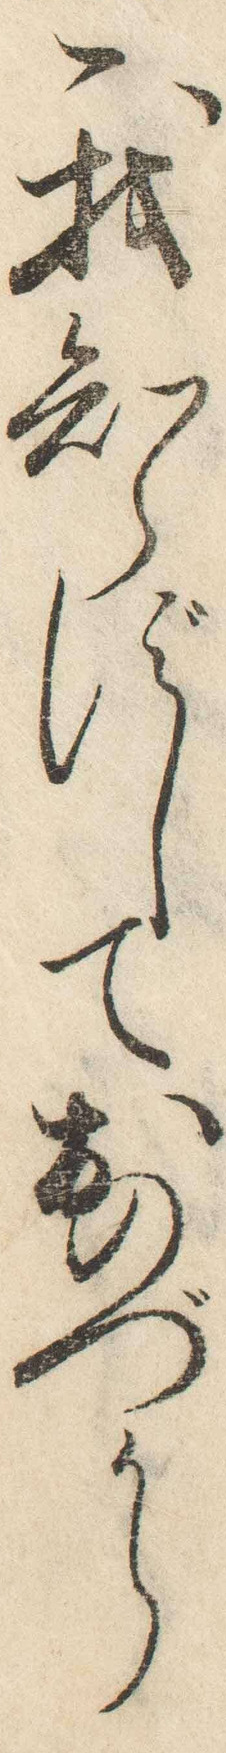我知らずしておのづから
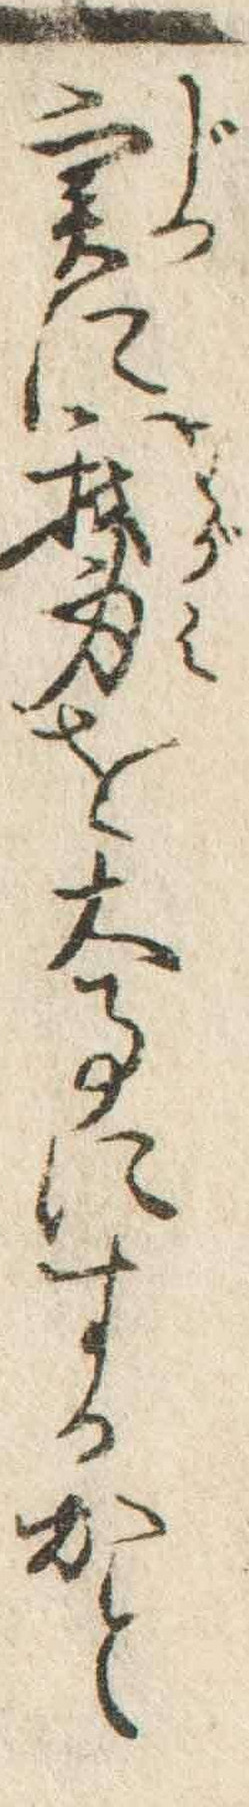実に我身を大事にするかと
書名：撫育草
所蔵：東京学芸大学附属図書館 国文学研究資料館
